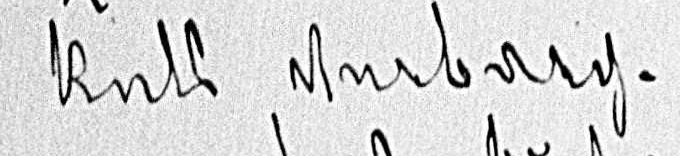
Rousek – dafür, daß Sofie Kafka freiwilling in den Tod
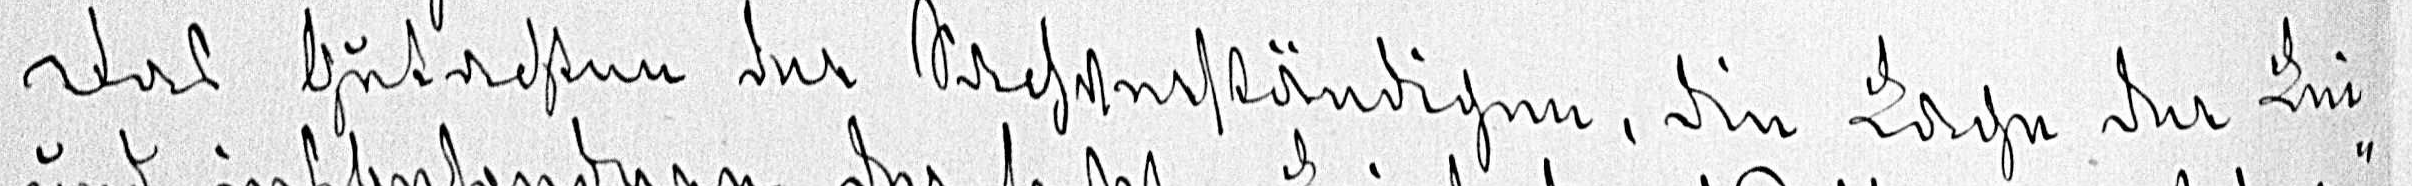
ging.
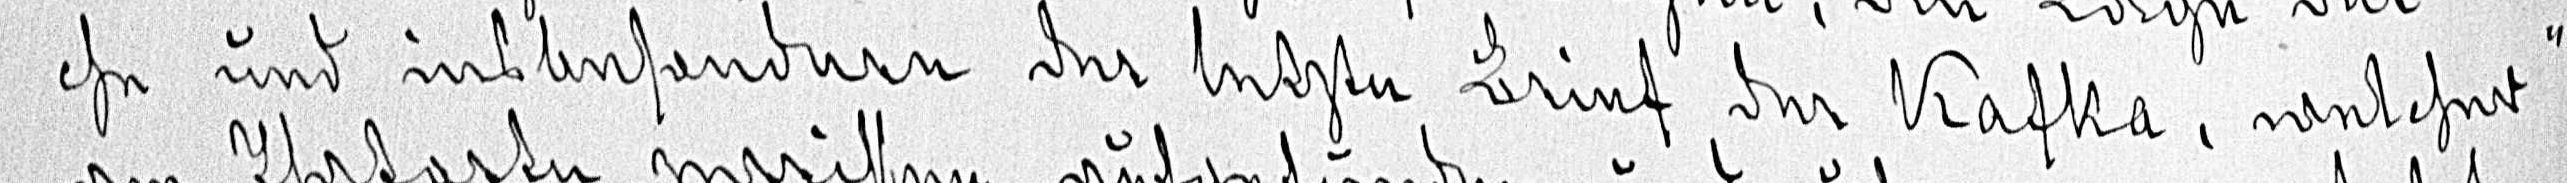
Bei der Hauptverhandlung wieerholte Rousek sein Ge¬
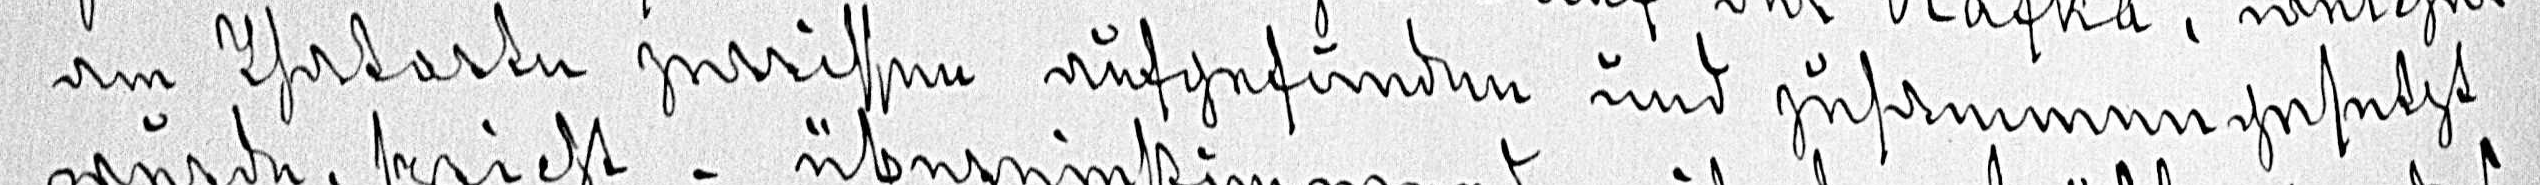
ständnis, sonst förderte dieselbe keine neuen wesentlichen
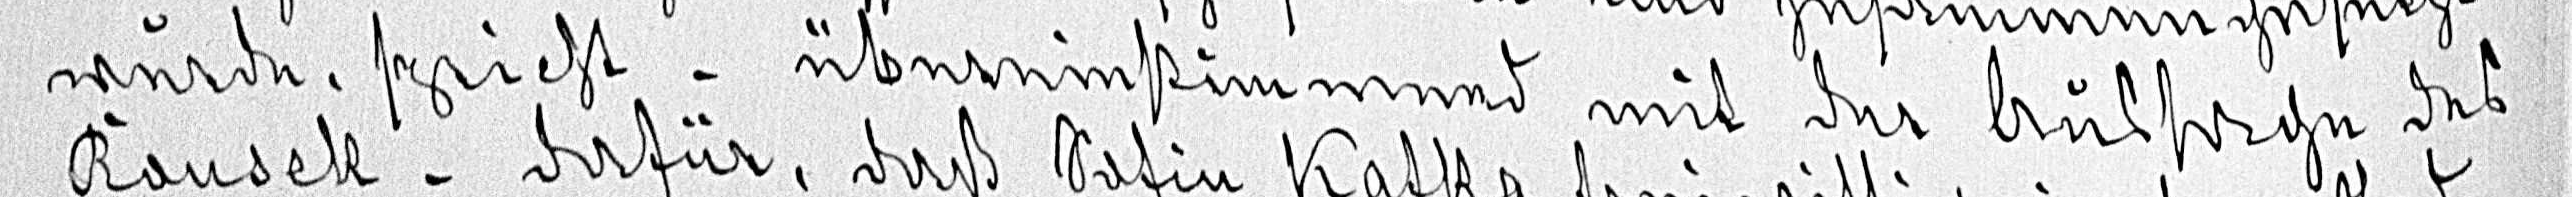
Momente zu Tage.
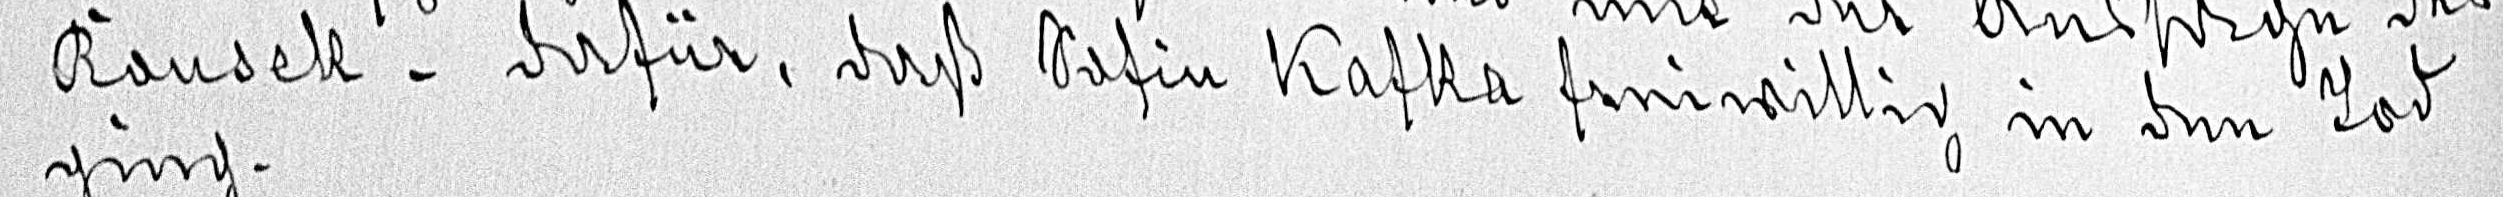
Auf Grund des mit 11>1 Stimme gefällten Wahrspru¬
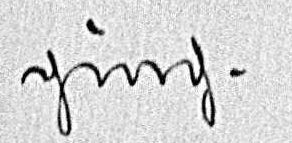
ches der Geschworenen wurde der 24 jahre alte Sattlergehil¬
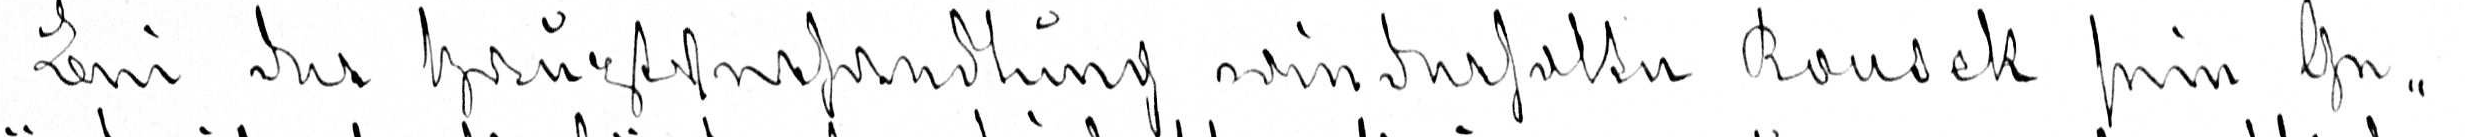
Bei der Hauptverhandlung wieerholte Rousek sein Ge¬
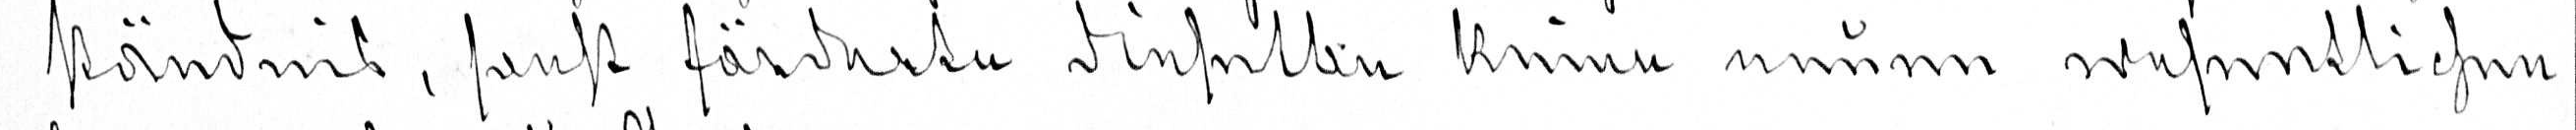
ständnis, sonst förderte dieselbe keine neuen wesentlichen
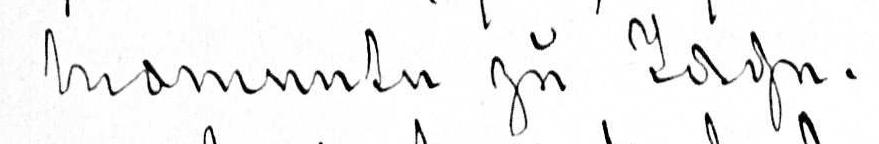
Momente zu Tage.
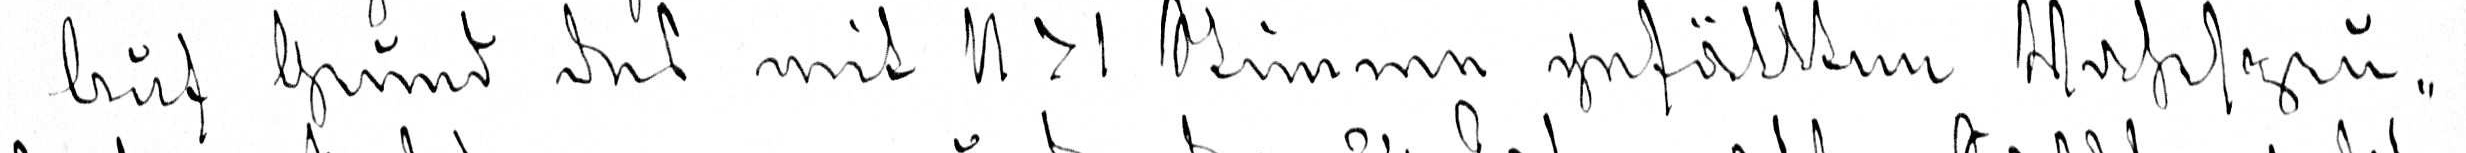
Auf Grund des mit 11>1 Stimme gefällten Wahrspru¬
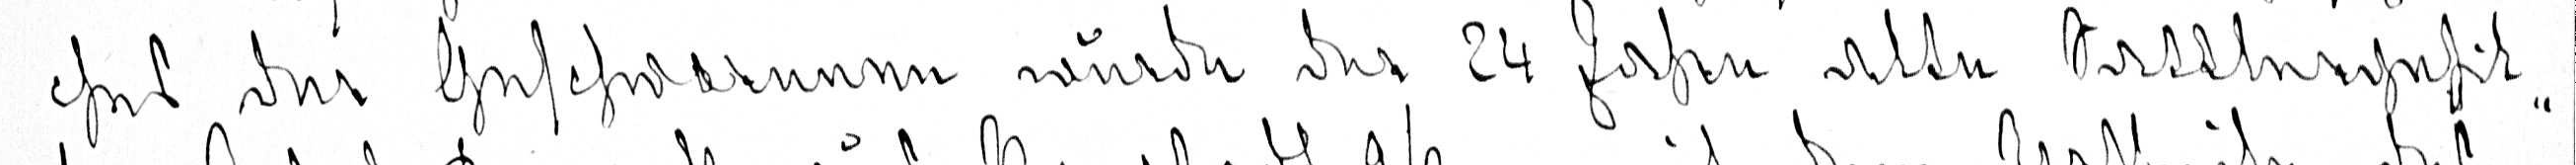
ches der Geschworenen wurde der 24 jahre alte Sattlergehil¬
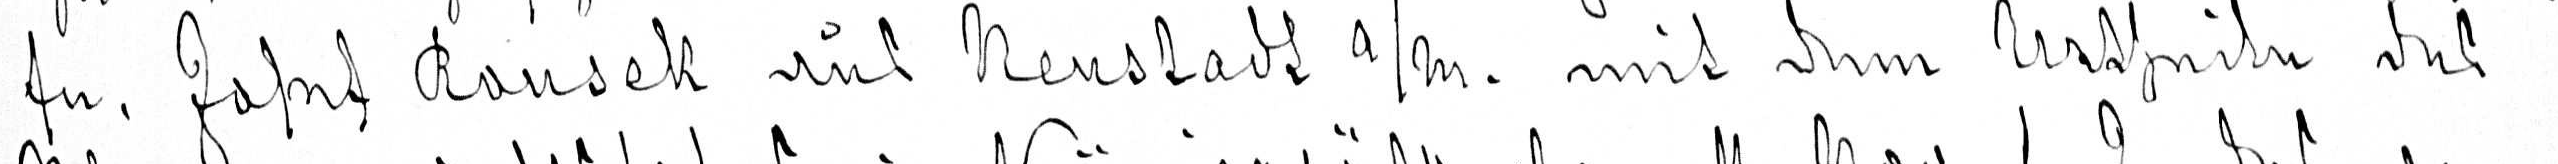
fe, Josef Rousek aus Nestadt a/M mit dem Urtheile des
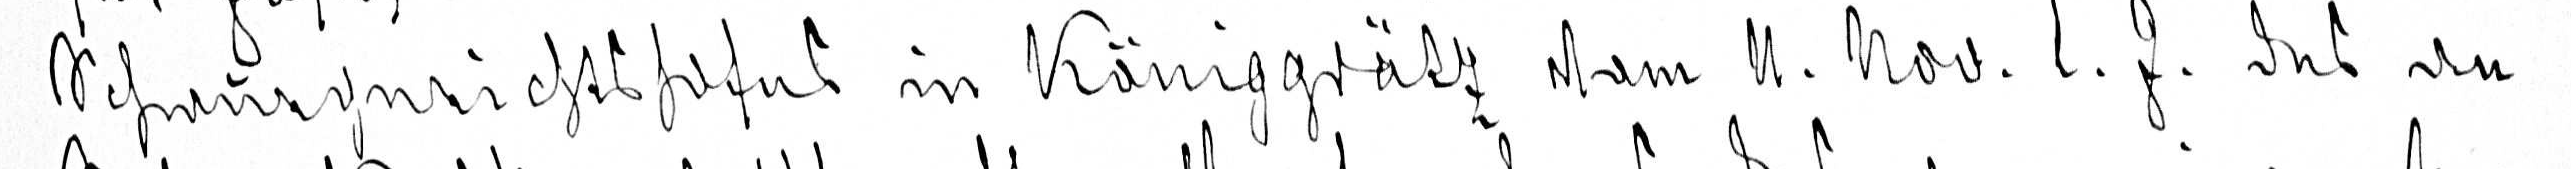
Schwurgerichtshofes in Königgrätz vom 11 Nov. L. J. des an
